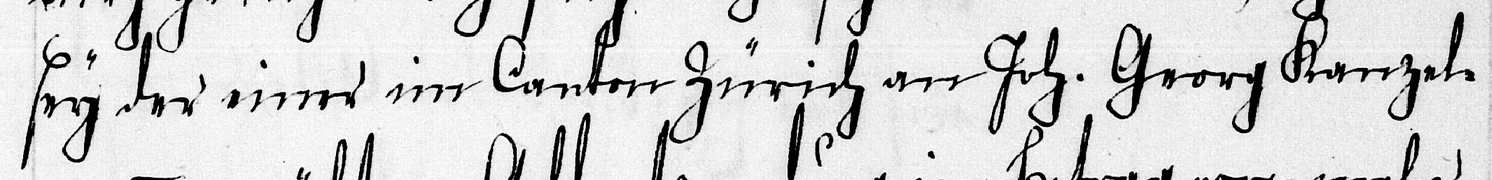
sey der einer im Canton Zürich an Joh. Georg Kanzel¬
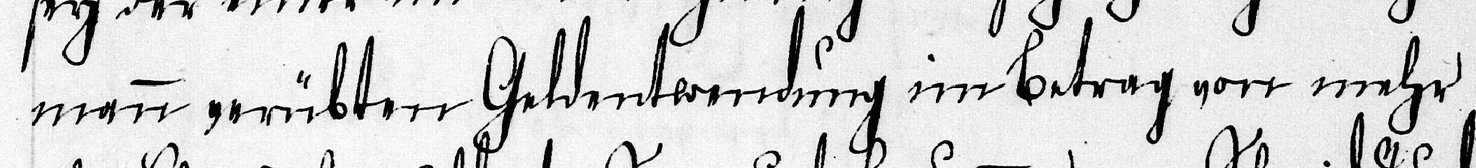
mann verübten Geldentwendung im Betrag von mehr
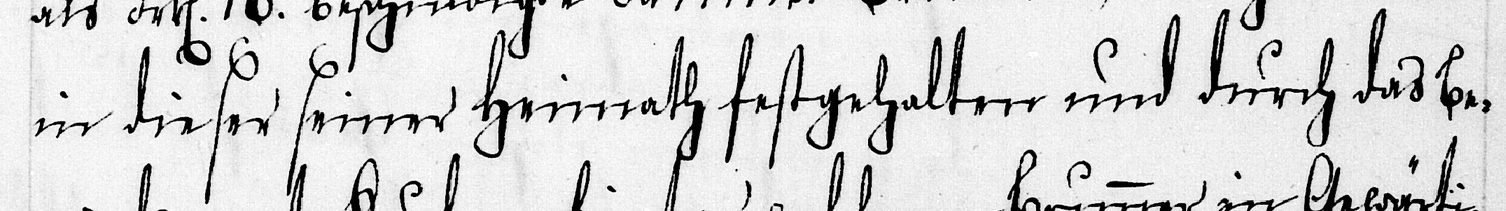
in dieser seiner Heimath festgehalten und durch das Be¬
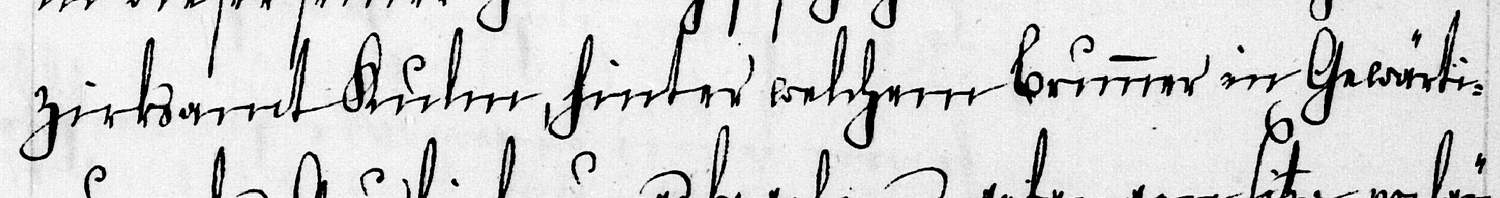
zirksamt Kulm, hinter welchem Brunner in Gewärti¬
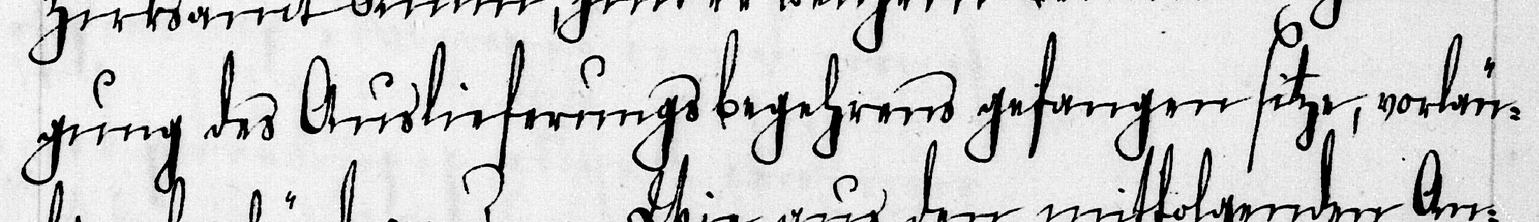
gung des Auslieferungsbegehrens gefangen sitze, vorläu¬
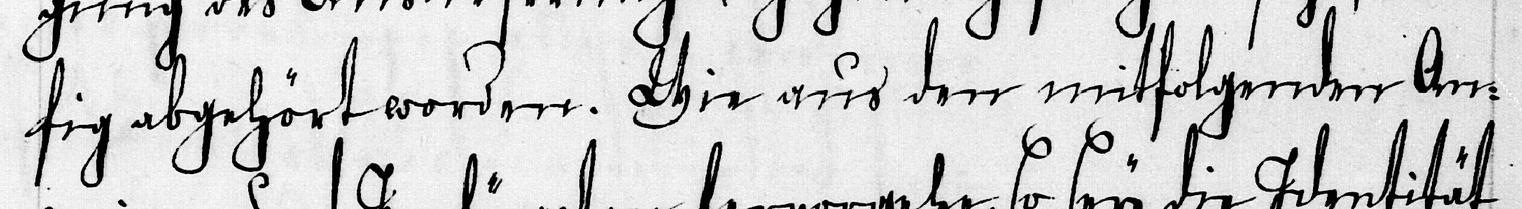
fig abgehört worden. Wie aus den mitfolgenden An¬
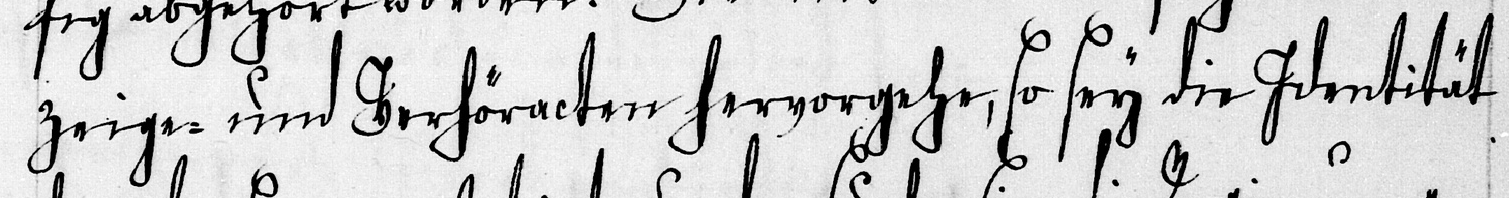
zeige- und Verhöracten hervorgehe, so sey die Identität
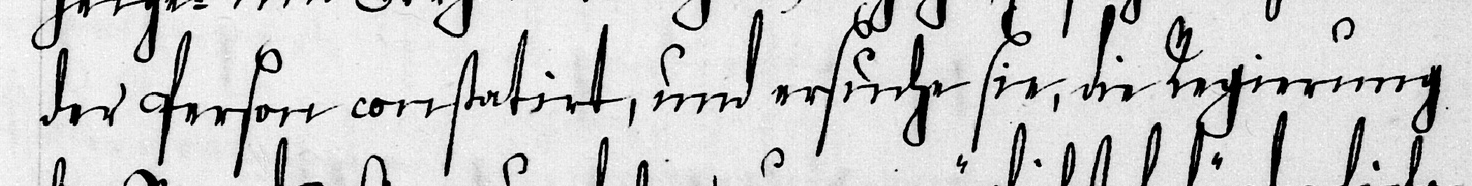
der Person constatirt, und ersuche sie, die Regierung
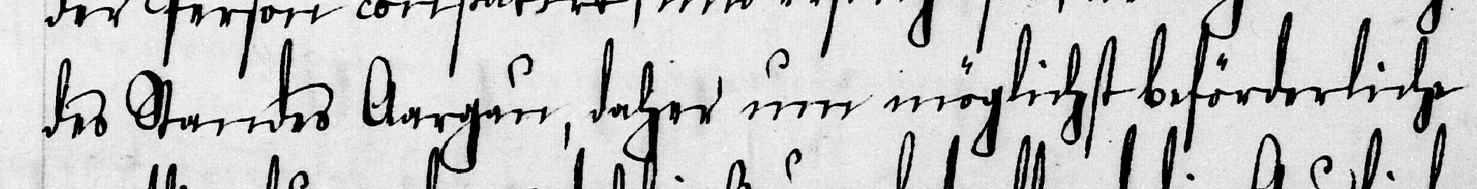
des Standes Aargau, daher um möglichst beförderliche
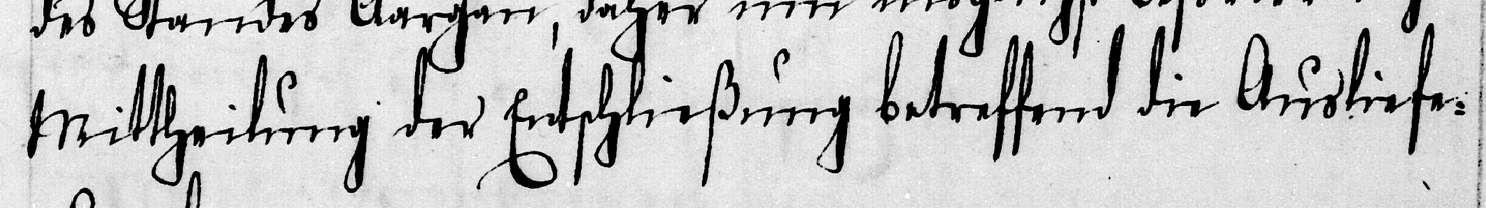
Mittheilung der Entschließung betreffend die Ausliefe¬
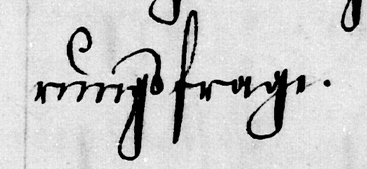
rungsfrage.
